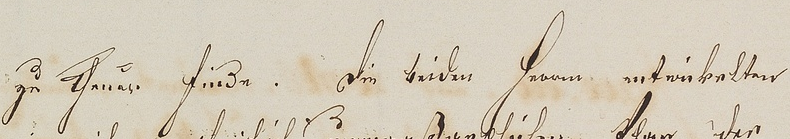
zu theuer finde. Die beiden Herren entwickelten
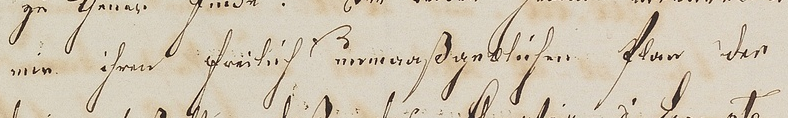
mir ihren freilich unmaaßgeblichen Plan der
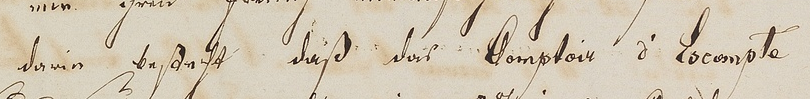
darin besteht daß das Comptoir d'Escompte
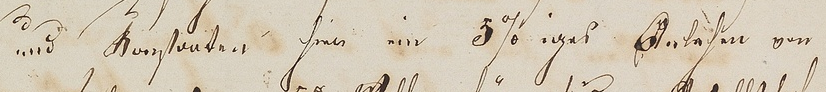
und Konsorten hier ein 5%iges Anlehen von
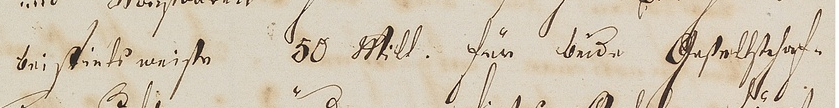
beispielsweise 50 Mill. für beide Gesellschaf-
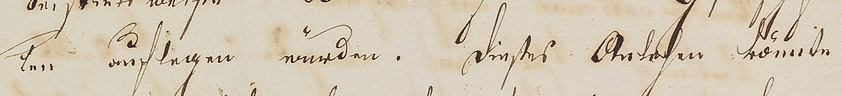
ten auflegen würden. Dieses Anlehen könnte
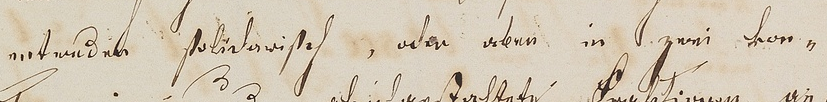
entweder solidarisch, oder aber in zwei kon-
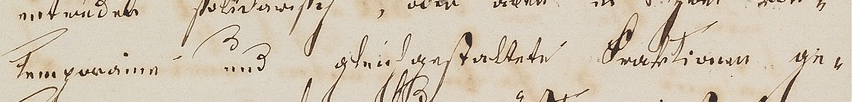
temporaine und gleichgestaltete Fraktionen ge-
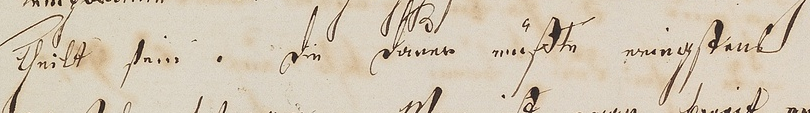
theilt sein. Die Dauer müßte wenigstens
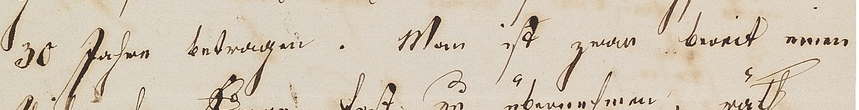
30 Jahre betragen. Man ist zwar bereit einen
